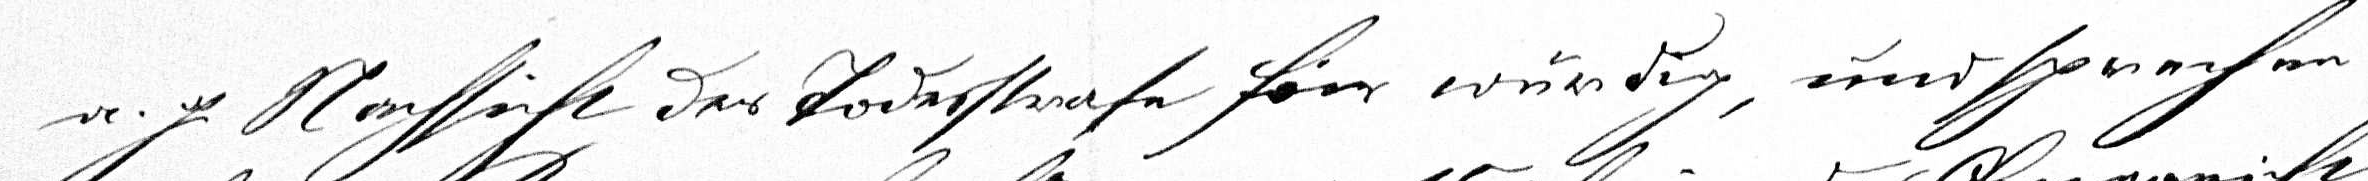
a. g. Nachsicht der Todestrafe xx wurdig, und sprechen
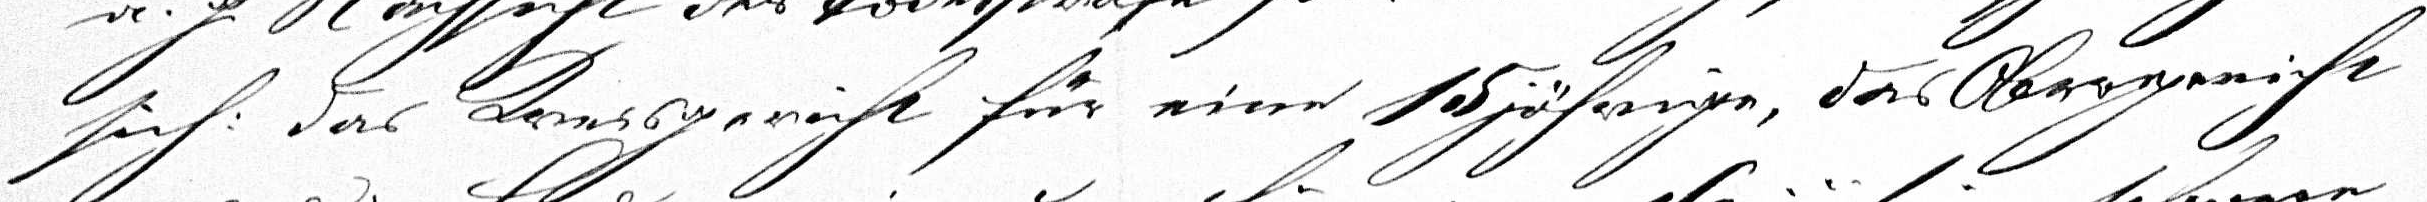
sich: das Kreisgericht für eine 15jährige, das Obergericht
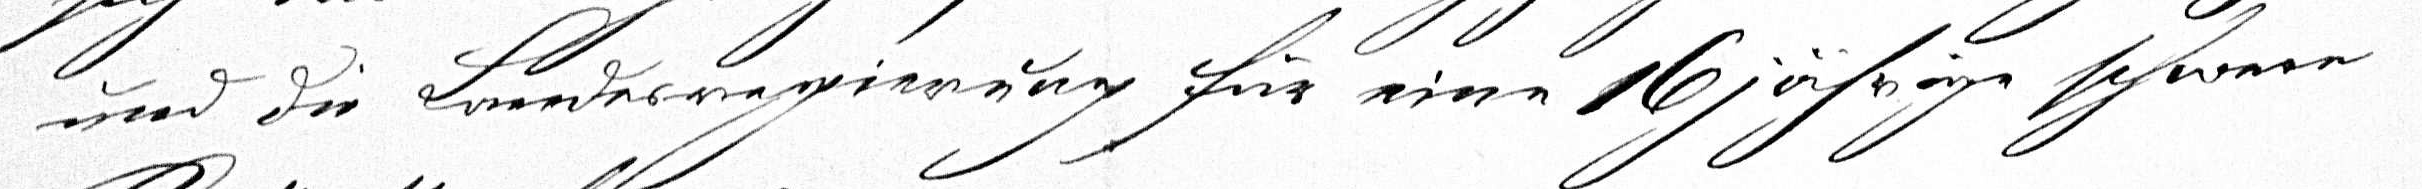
und die Landesregierung für eine 16jährige schwere
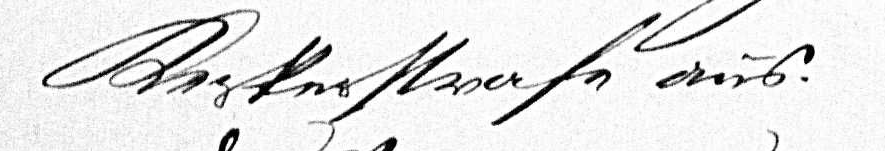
Kerkerstrafe aus.
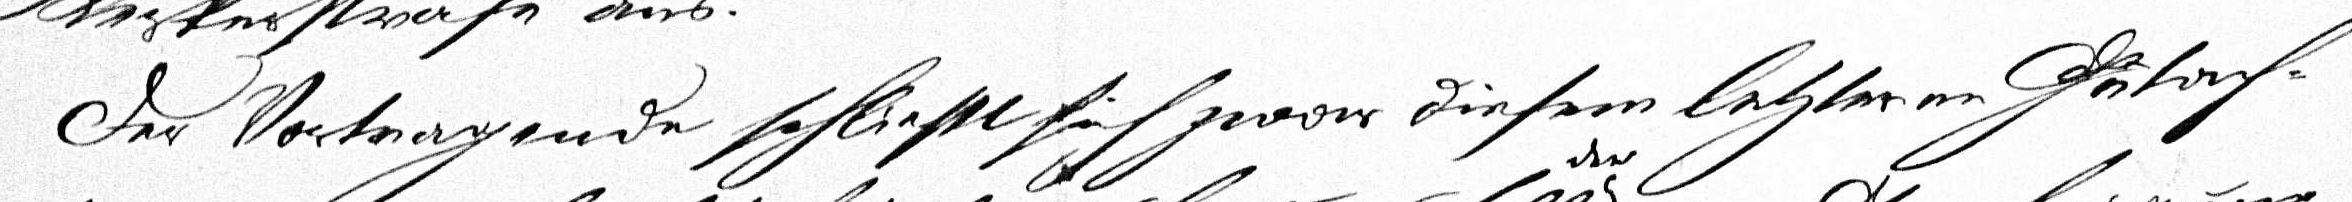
Der Vortragende schließt sich zwar diesem letzteren Gutach¬
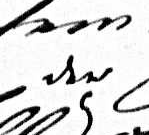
der
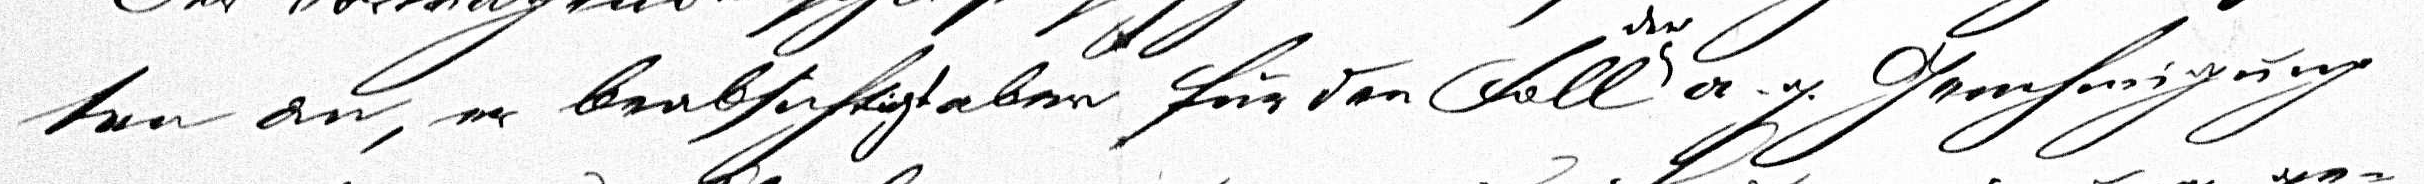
ten an, er beabsichtigt aber für den Foll a. g. Genehmigung
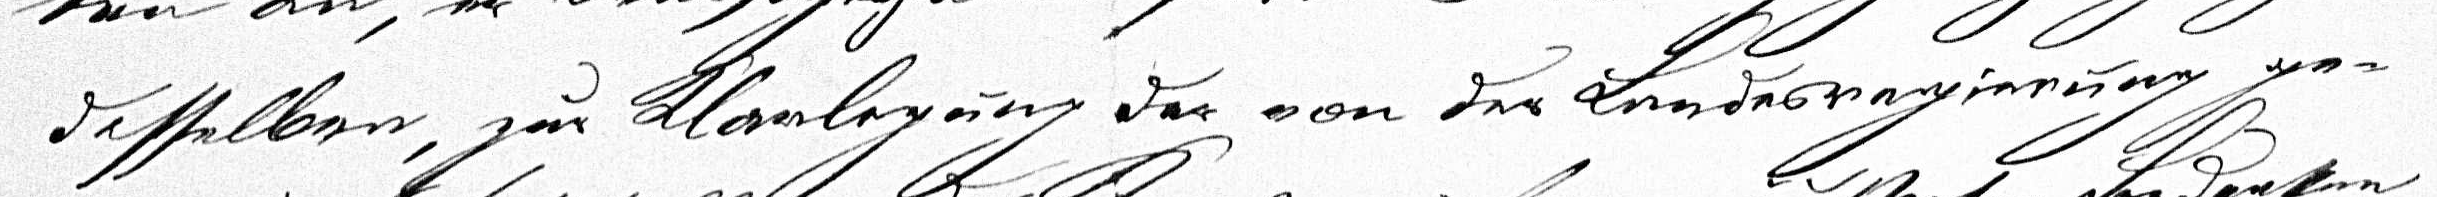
desselben, zur Klarlegung der von der Landesregierung ge¬
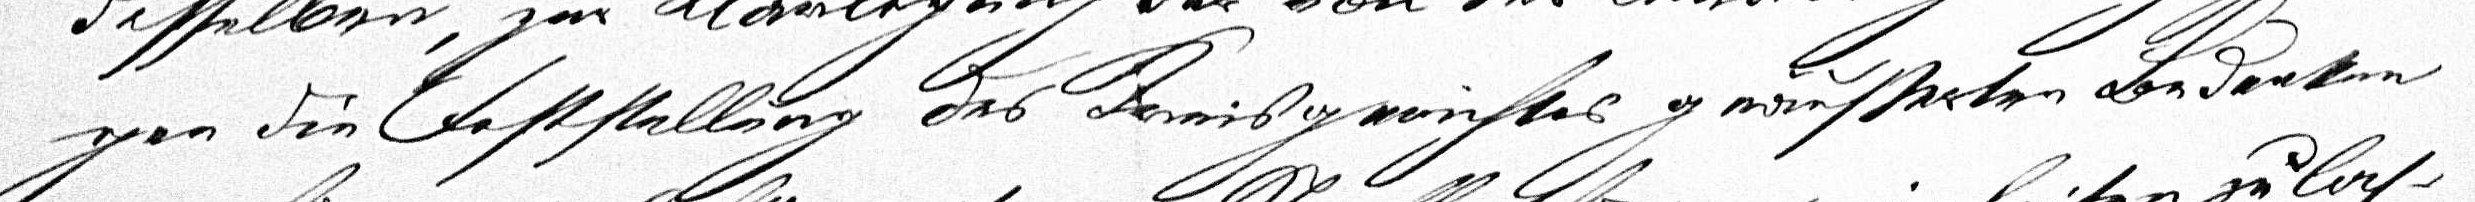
gen die Feststellung des Kreisgerichtes geäußerten Bedenken
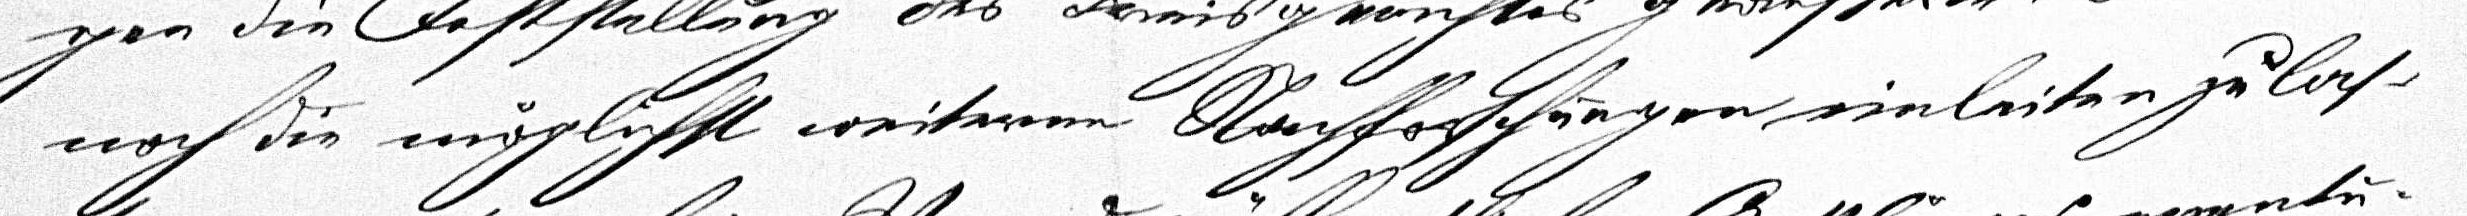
noch die möglichst weiteren Nachforschungen einleiten zu las¬
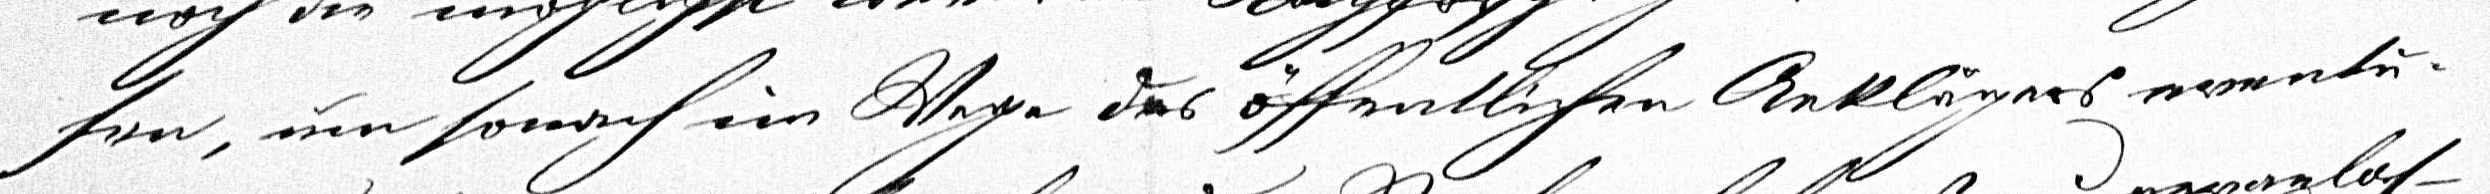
sen, um sonach im Wege des öffentlichen Anklägers eventu¬
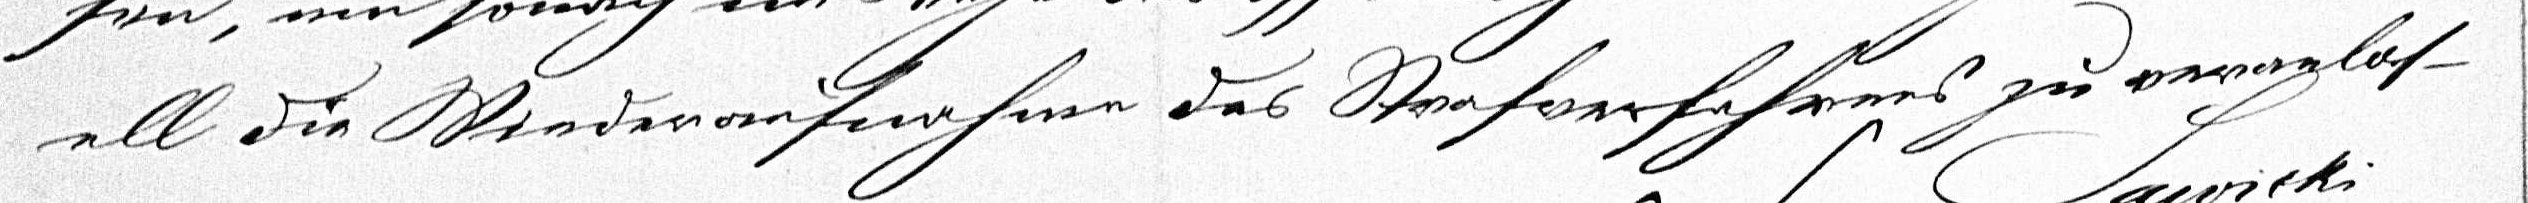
ell die Wiederaufnahme des Strafverfahrens zu veranlas¬
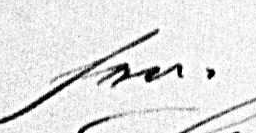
sen.
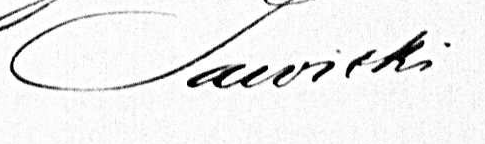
Sawicki
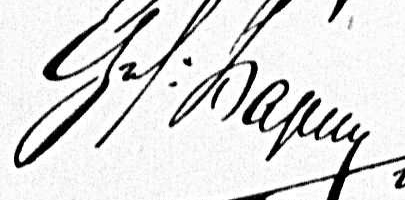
Ges: xx
